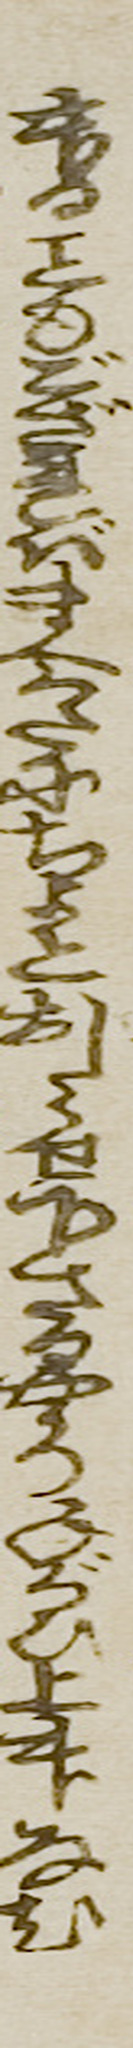升ることもござればまへかたにちよとおしらせ下さるやうねがひ上升なむ
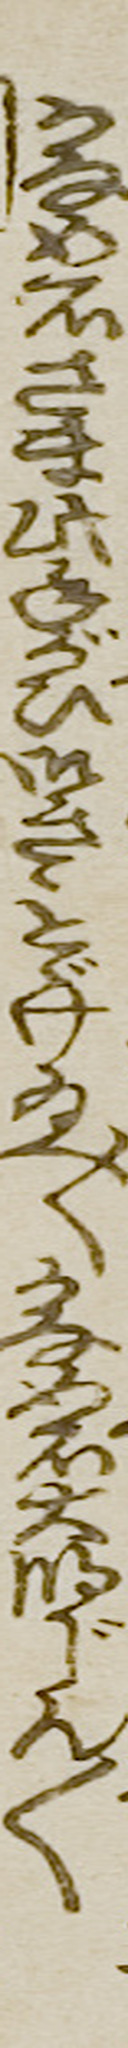かなめ石さま此ねがひ御きゝとゞけ給へ〳〵かなめ石大明じん〳〵
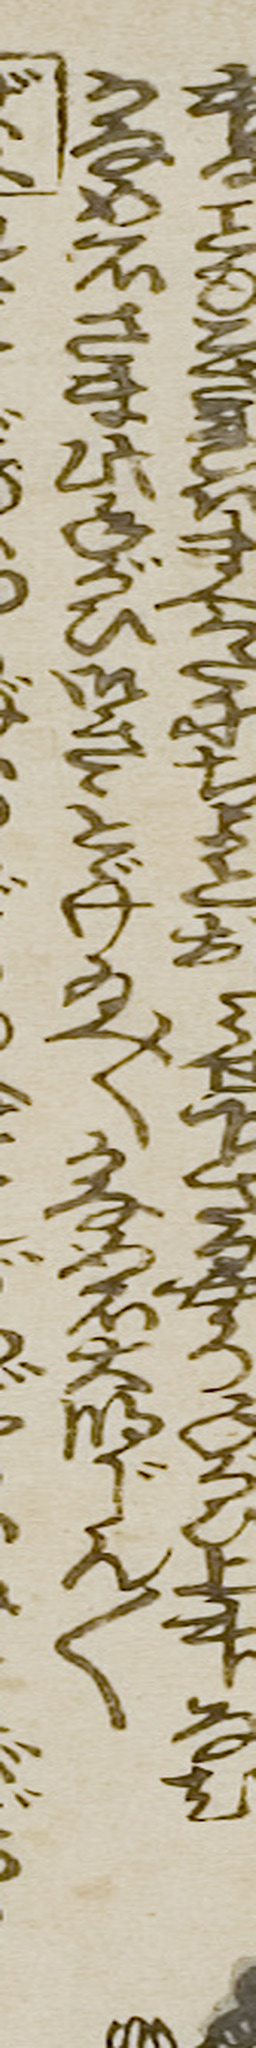かなめ石さま此ねがひ御きゝとゞけ給へ〳〵かなめ石大明じん〳〵
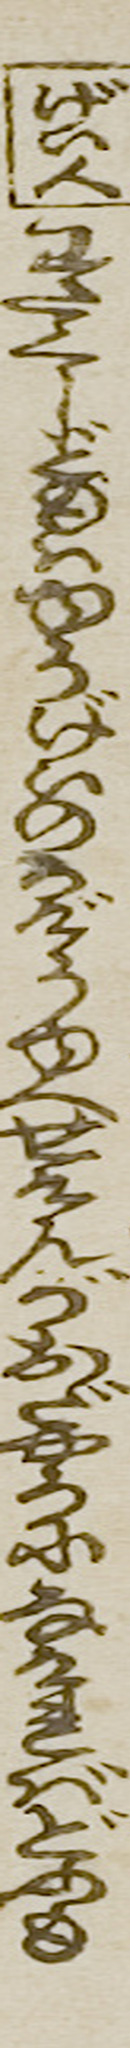げい人わたくしどもはゆうげいのかげうゆへせけんがおだやかになければどふも
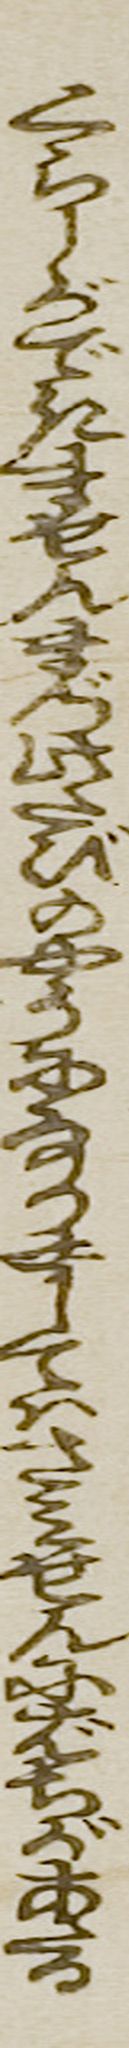くらしができませんまづ此たびのやうになりましてはさみせんにばちがあたる
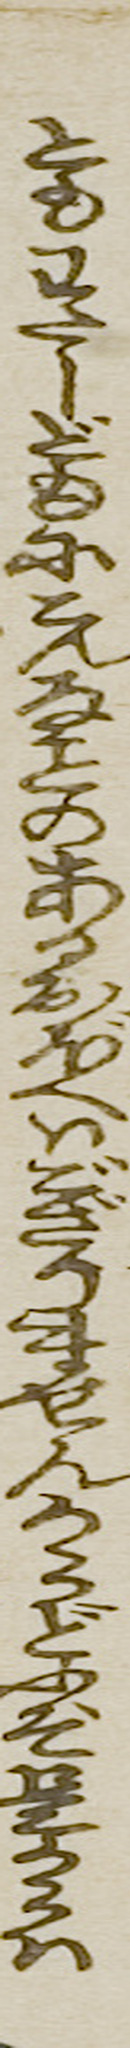ともわたしどもにこんなことのあるおぼへはござりませんからどふぞ是からは
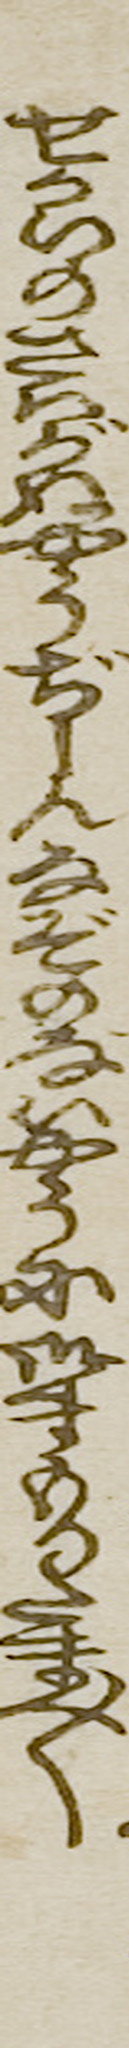せかいのさはがぬやうぢしんなぞのないやうに御まもりたまへ〳〵
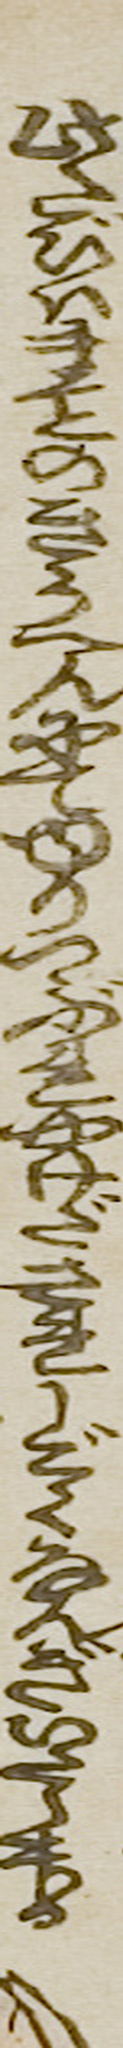此たびはまことのきうへんにてゆりつぶれやけだされしごくなんぎいたし升る
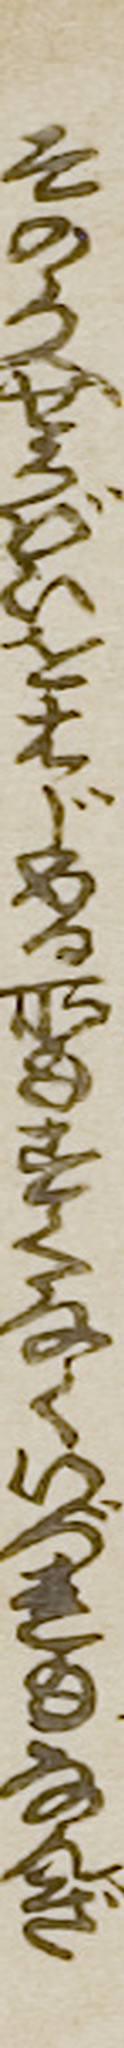そのうへせうばいをはじめる所もすくなくいづれもなんぎ
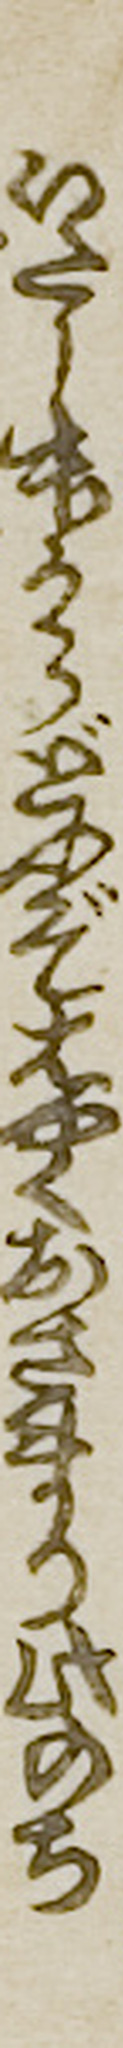いたし升からどふぞはやくおさまり此のち
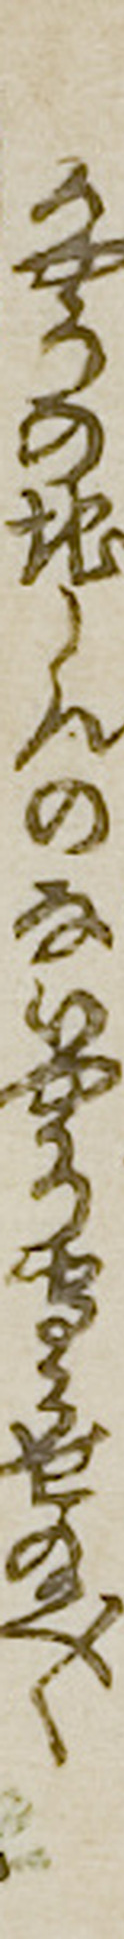かやうの地しんのないやう守らせ給へ〳〵
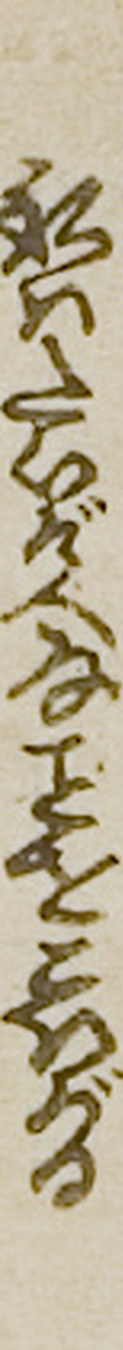私はたいげへなことをこはがる
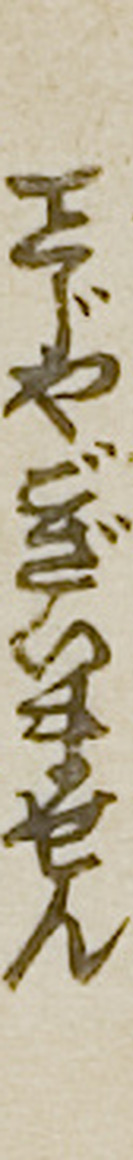ことじやございません
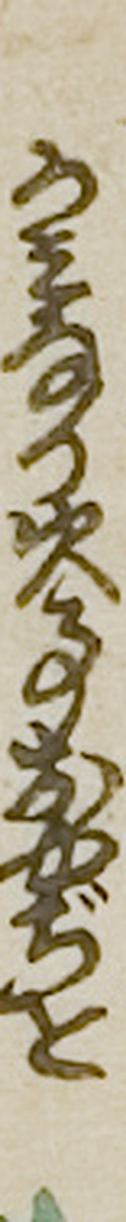かみなり火事おやぢと
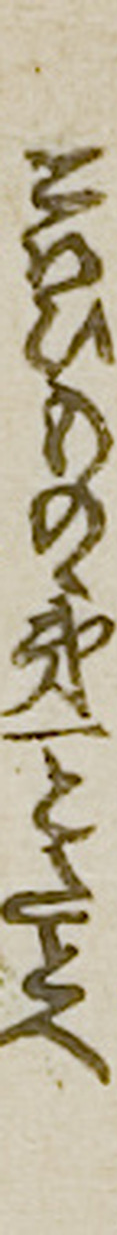こはひもの第一とたとへ
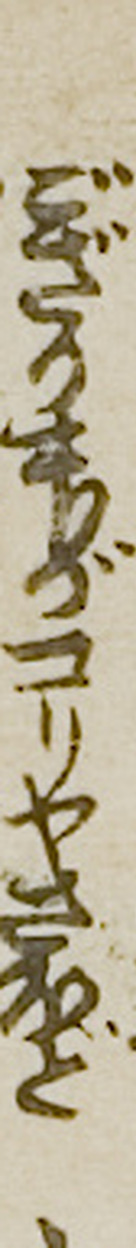ござり升がこりやさほど
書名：あんしん要石
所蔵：東京大学総合図書館 General Library in the University of Tokyo, JAPAN
